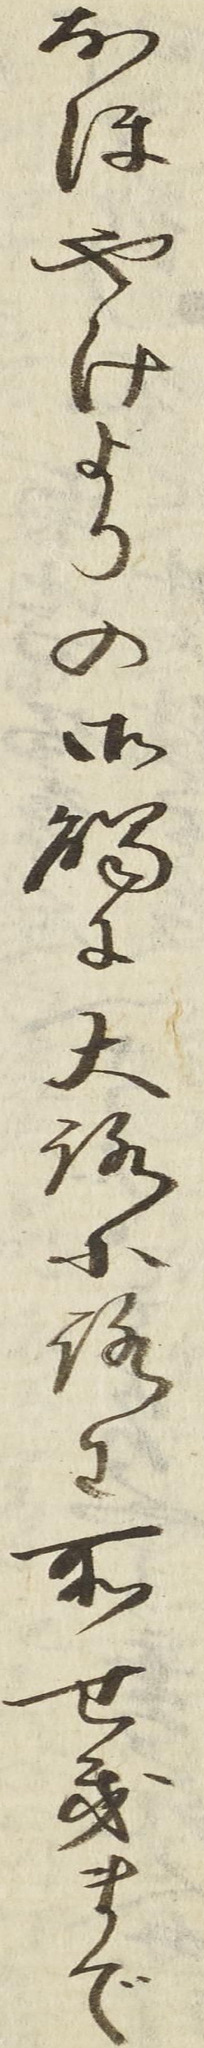おほやけよりのつね御觸に大路小路に所せきまで
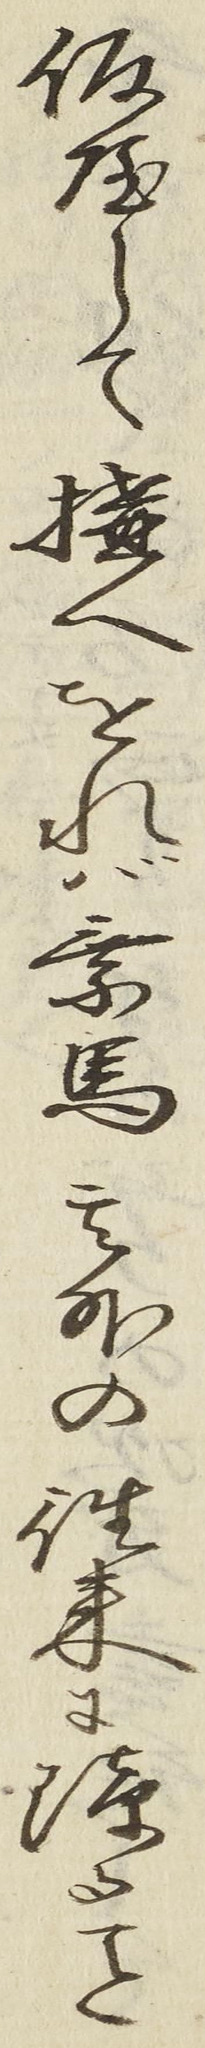仮屋して構へをれば乗馬其外の往来に障ること
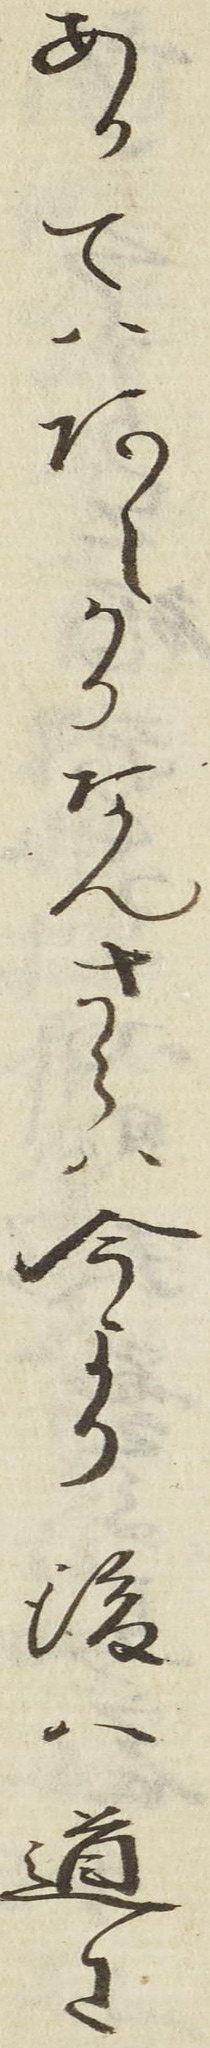ありてはあしかりなんさらは今より後は道に
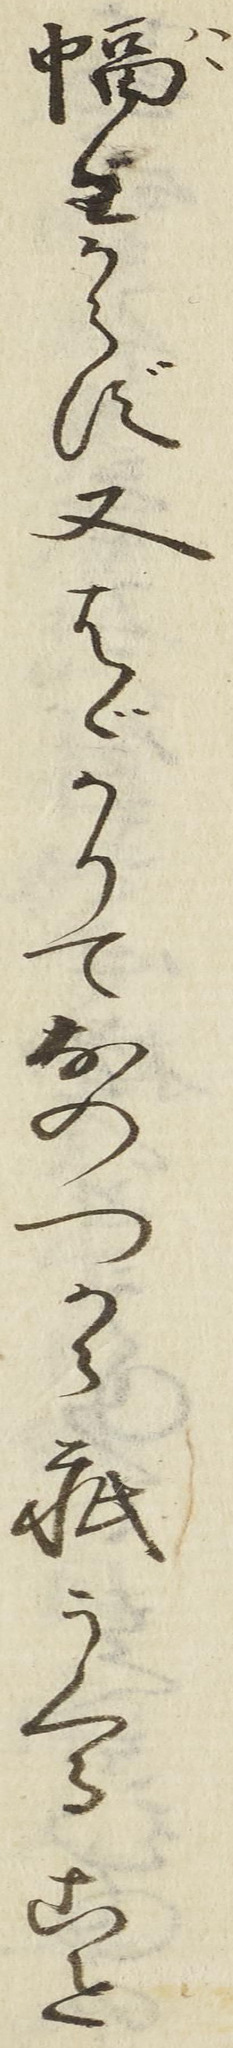幅わからず又はゞかりておのつから疵うくること
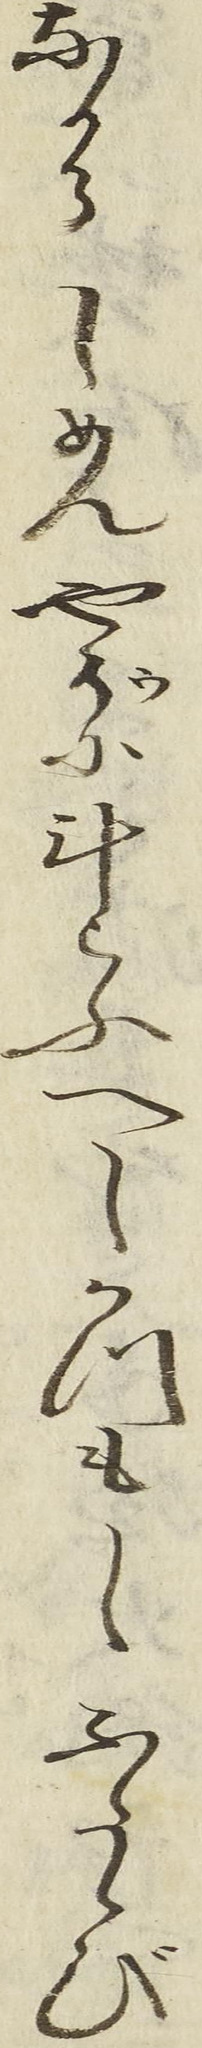なからしめんやうウに計らふへしかつもしふたゝび
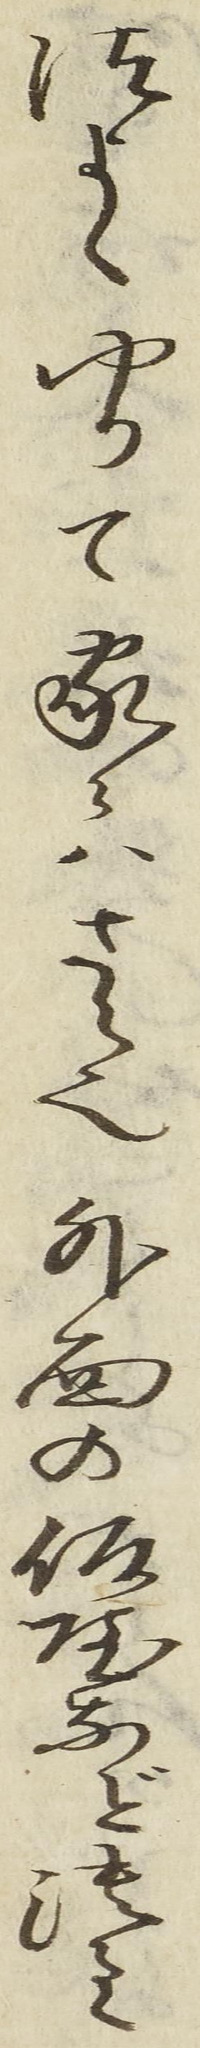つよくゆりて家〻はさら也外面の仮屋など潰るゝ

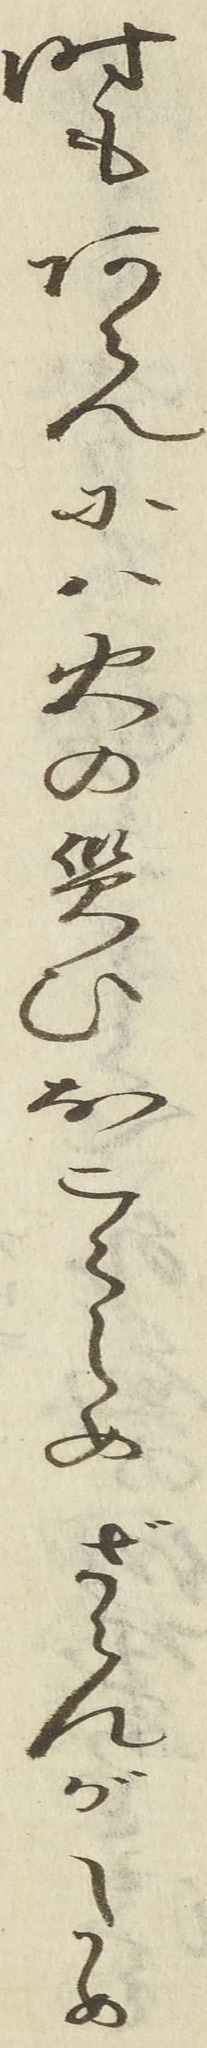時もあらんには日の災ひおこらしめざらんがため
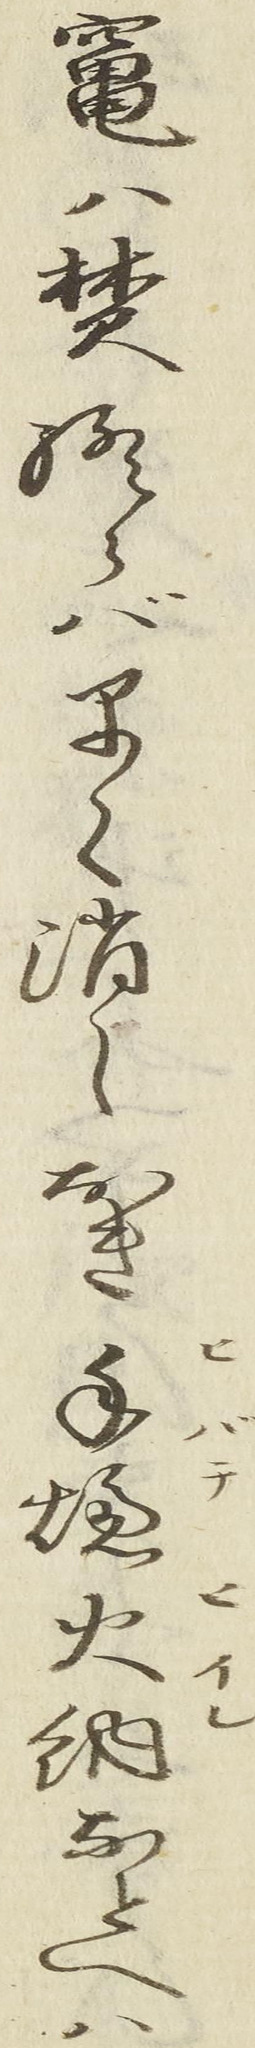竃は焚終らば早く消しおき手爈火納なとへは
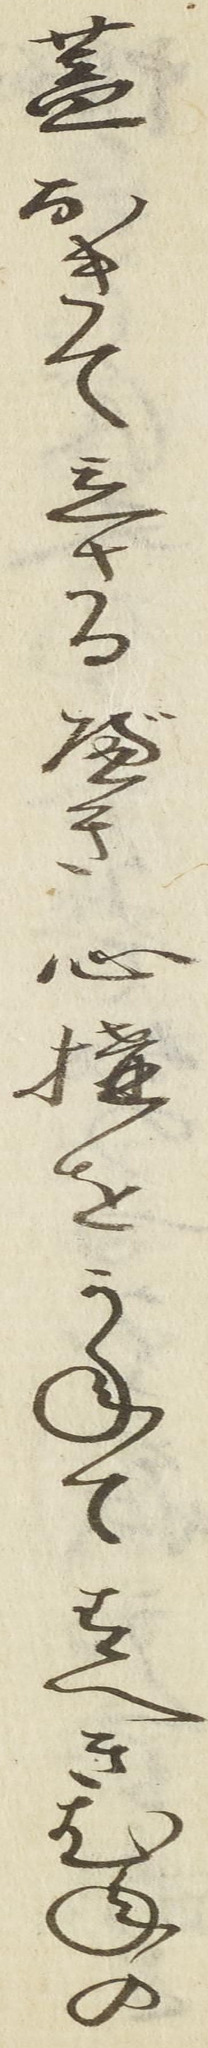蓋おきて立さるべき心構をかねてすへきむねの
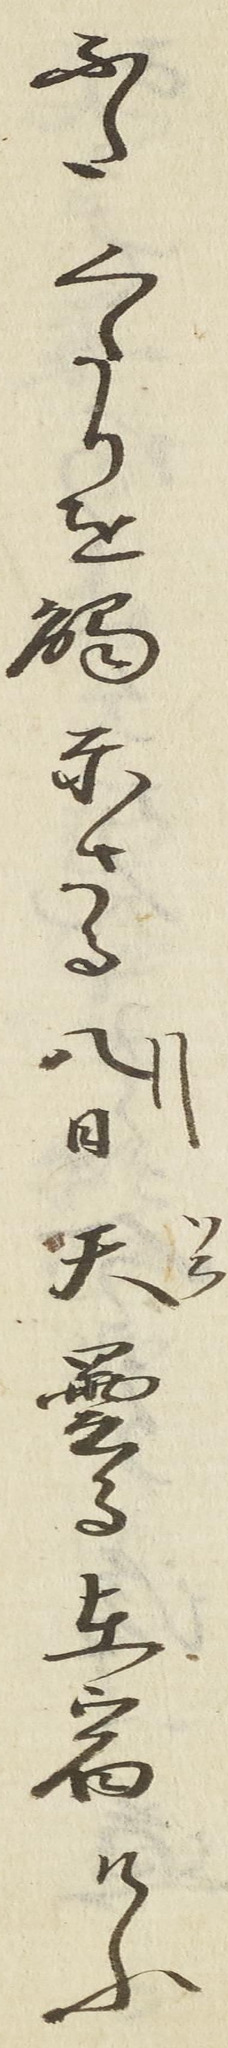ふたくたりを觸示さる八日天曇る在宿けふ
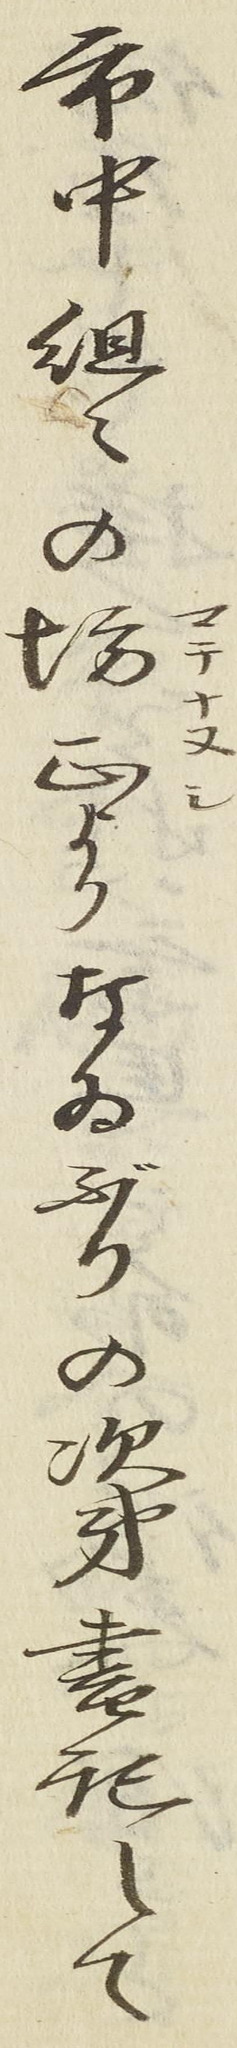市中組〻の坊正よりなゐぶりの次第書記して
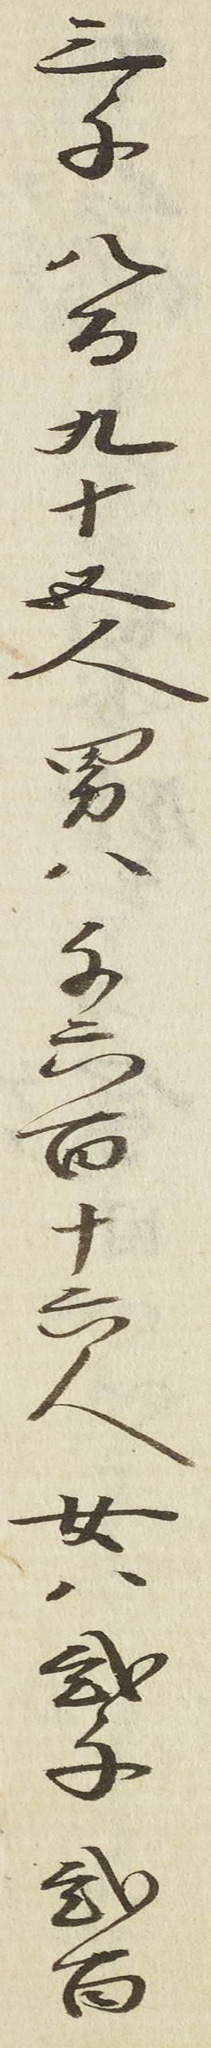三千八百九十五人男は千六百十六人女は弐千弐百
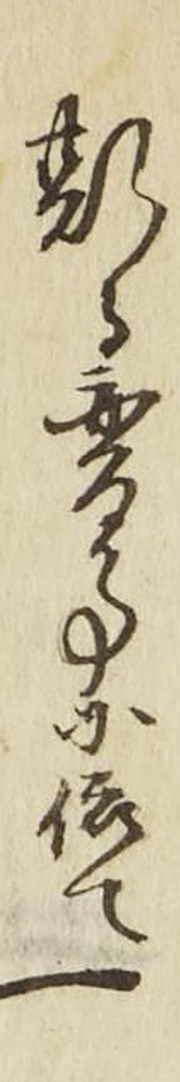斯る変事に依て
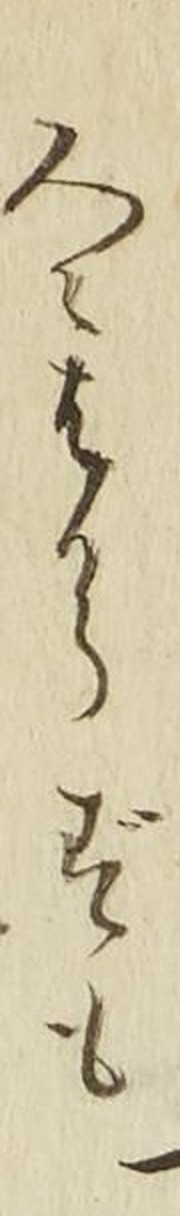人〻はからずも
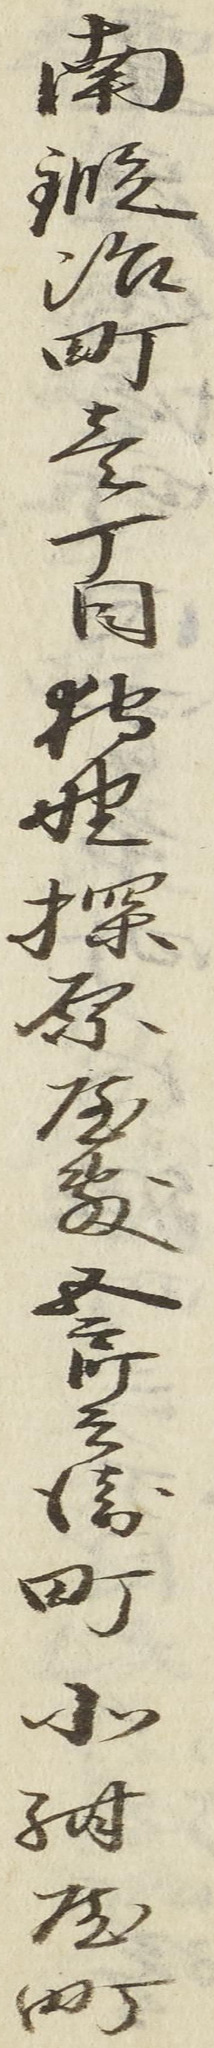一南鍛冶町壱丁目狩野探原屋敷五郎兵衛町北紺屋町
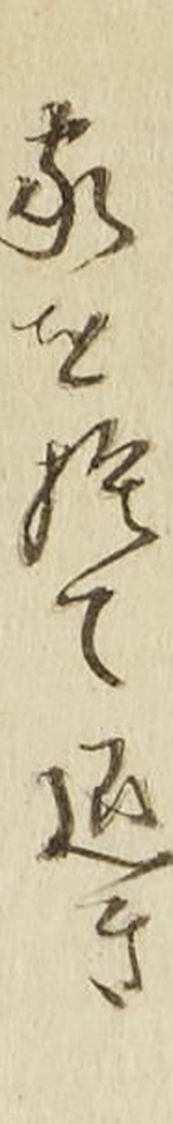家を捨て退き
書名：やぶれ窓の記　全
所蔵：東京大学地震研究所図書室 Earthquake Research Institute Library, The University of Tokyo, JAPAN
